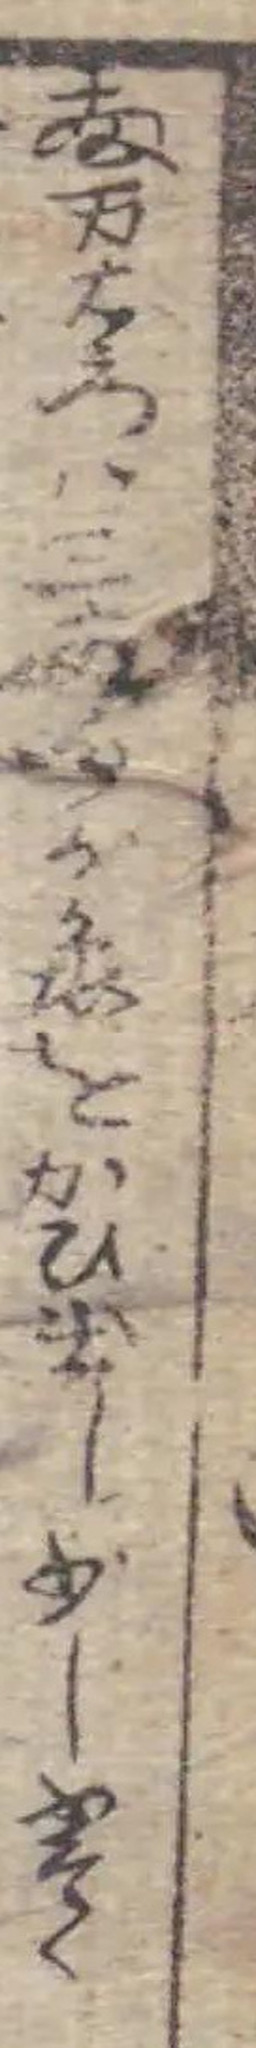扨万右衛門は三両分が亀をかひ出し少しふそく
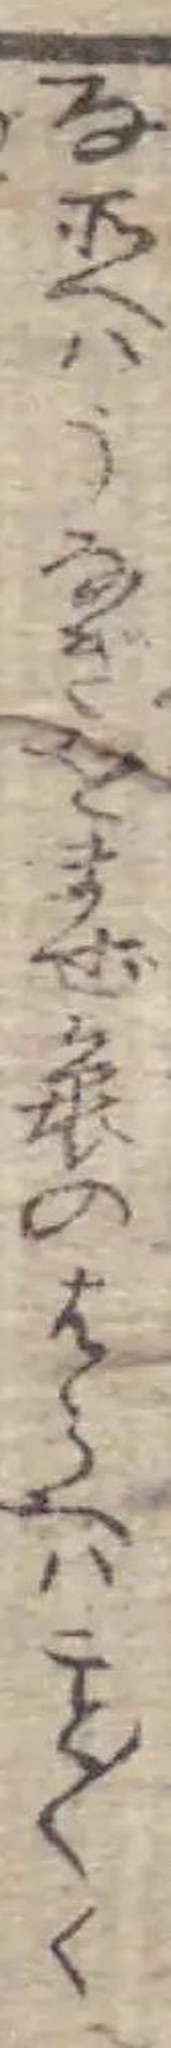な所へはうなぎをまぜ亀のはらへはこと〳〵く
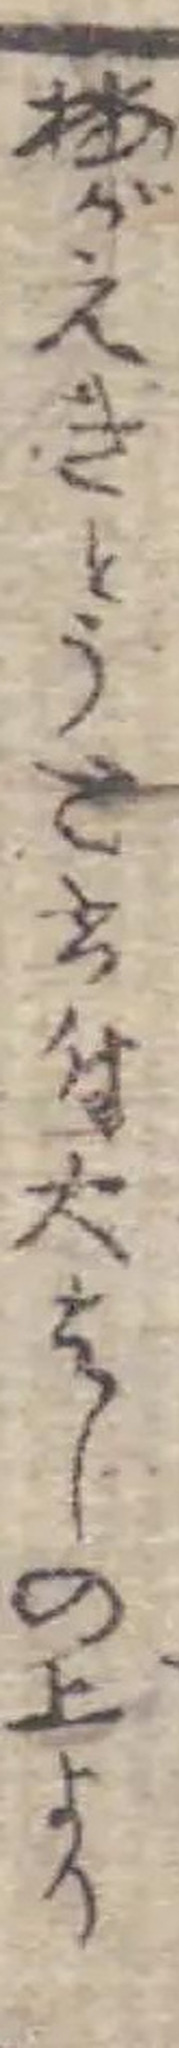梅がえきとうと書付大はしの上より
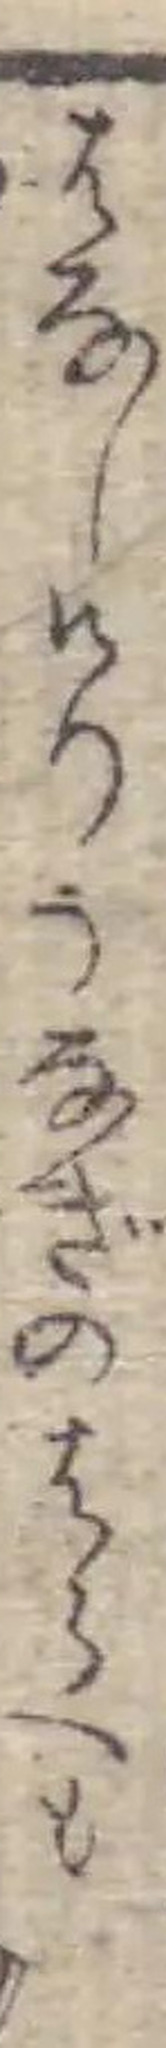はなしけりうなぎのはらへも
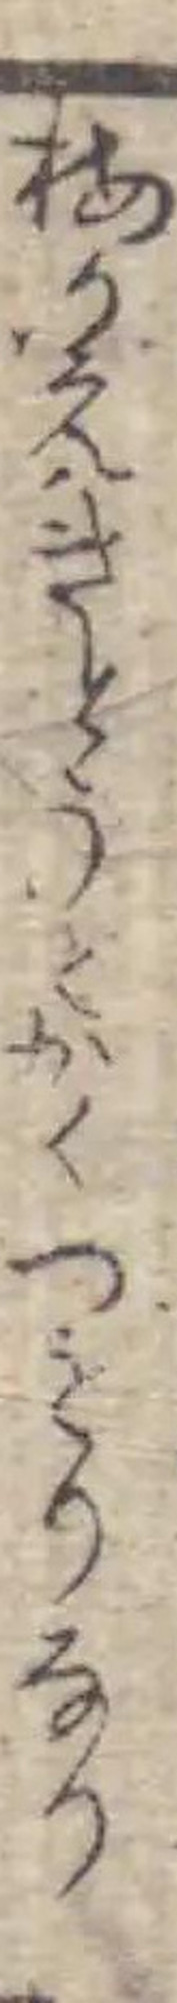梅がえきとうとかくつもりなり
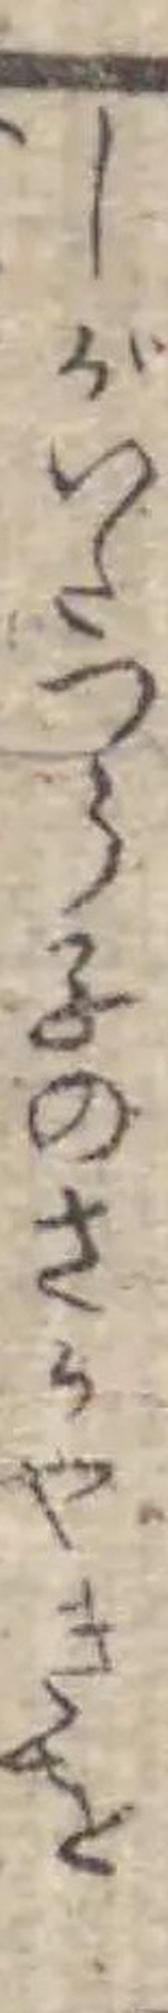しがいたつら子のさかやきを
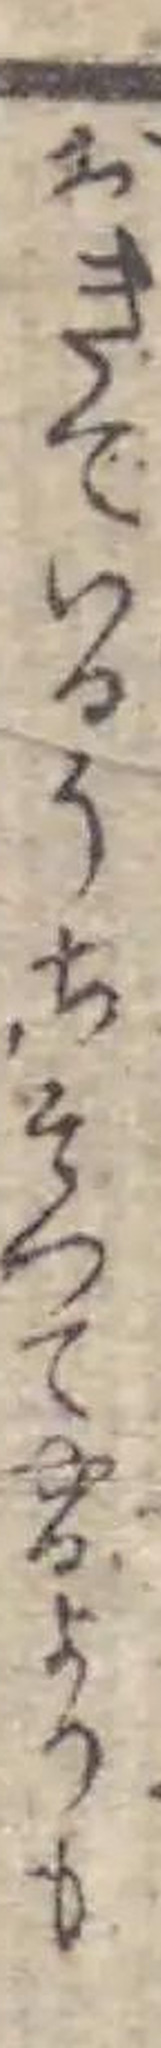おきているうちそつてやるよりも
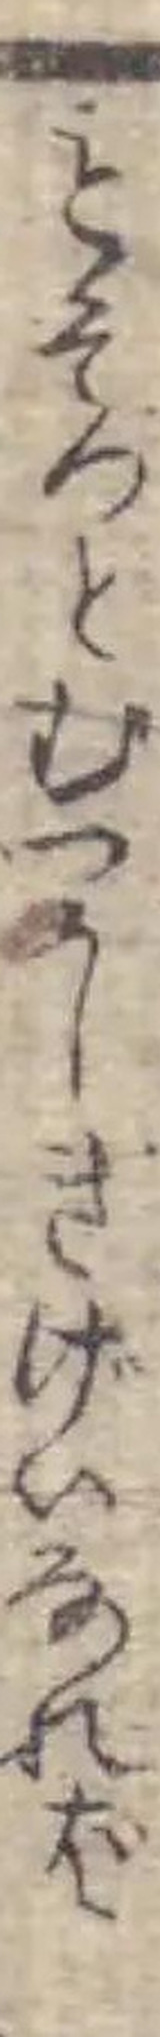もそつとむつかしきげいなれば
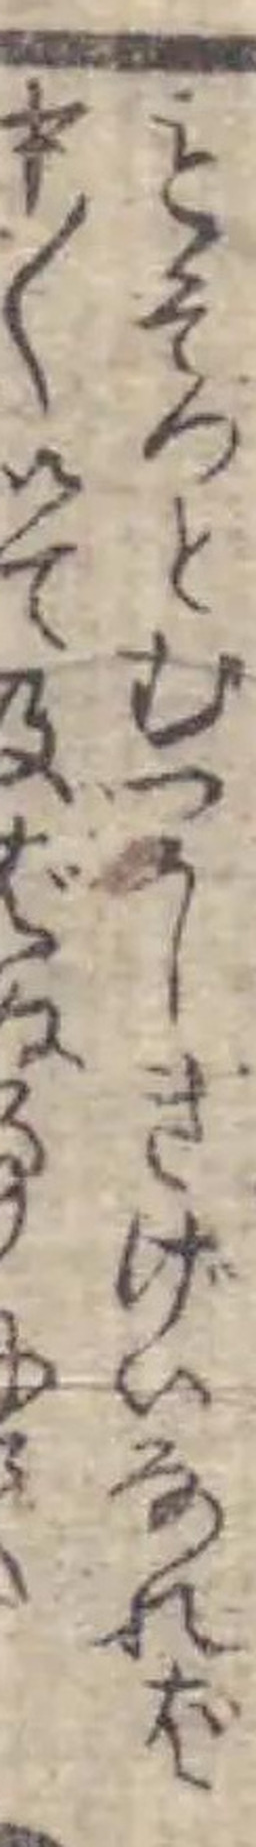中〳〵以て及ばぬ事にて
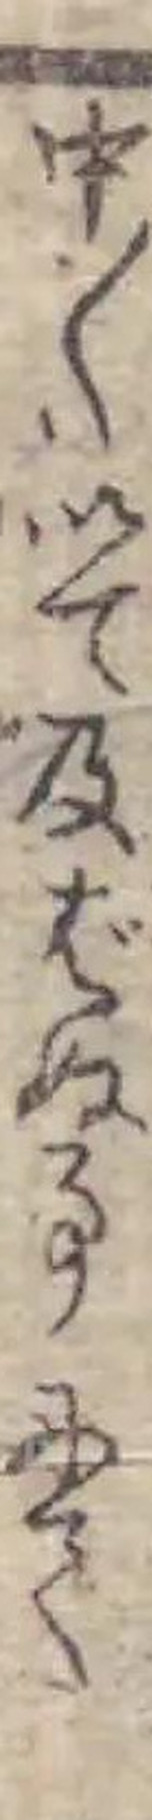中〳〵以て及ばぬ事にて
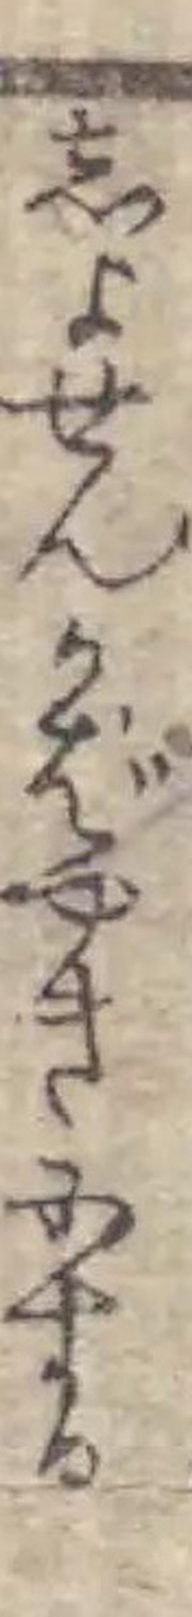しよせんかばやきにする
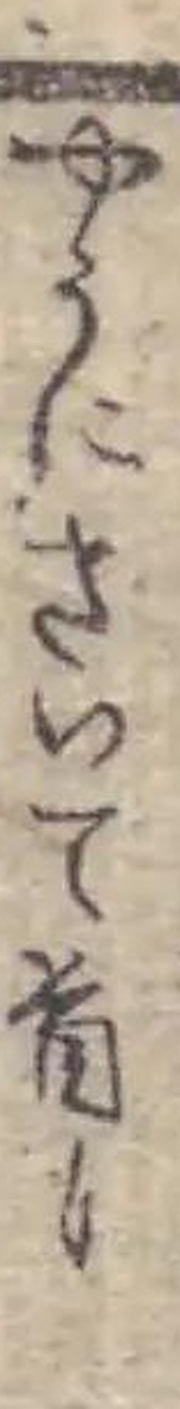やうにさいて首も
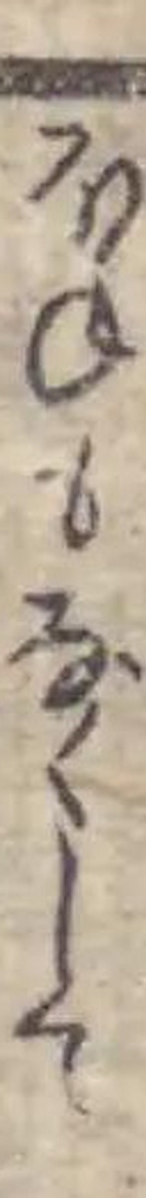ほねもなくして
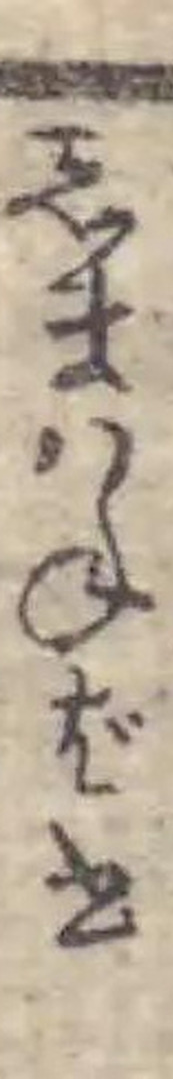しまはねば書
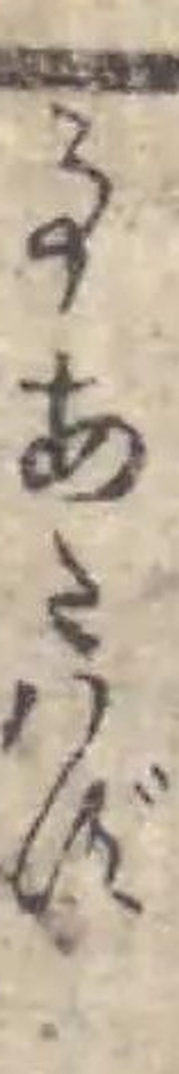事あたはず
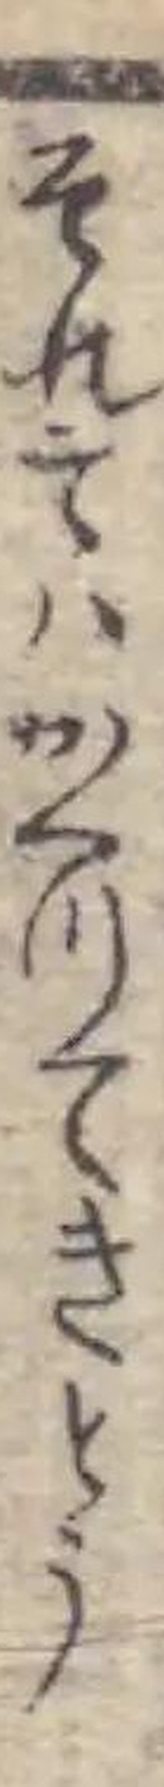それてはかへつてきとう
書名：見立蓬莱 : 2巻
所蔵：国立国会図書館 National Diet Library, JAPAN
